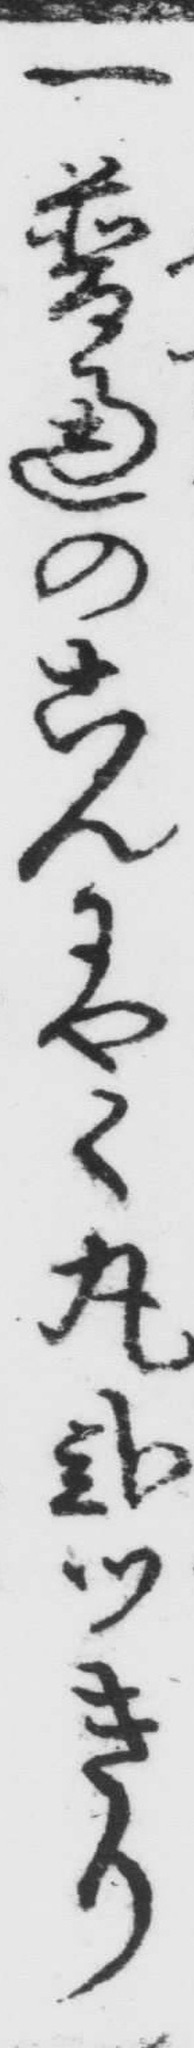一普通のこんにやく丸弐ツきり
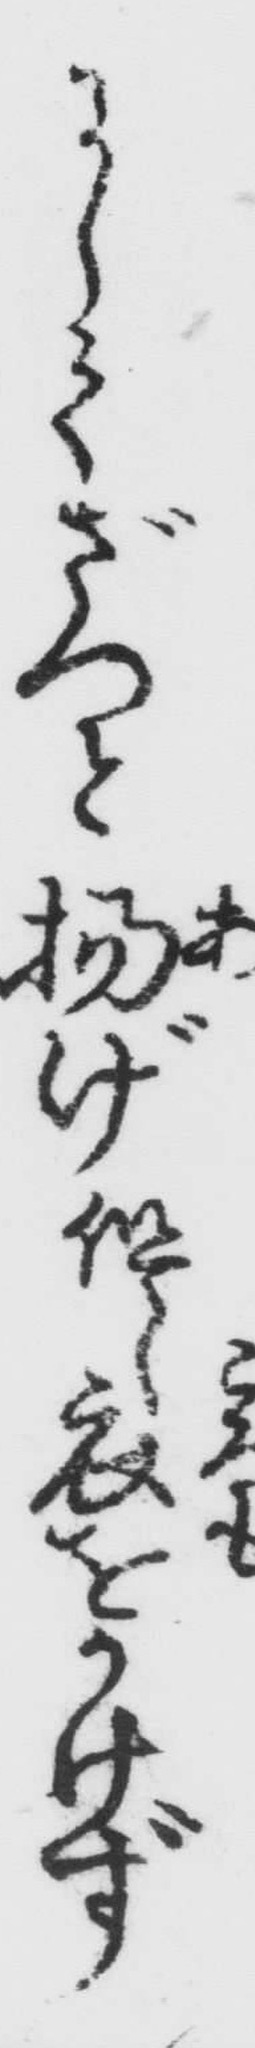にしてざつと揚げ但し衣をかけず
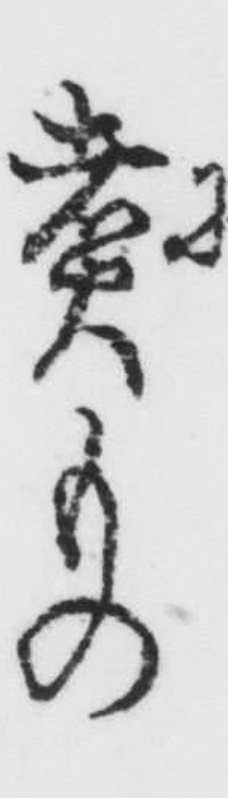煮もの
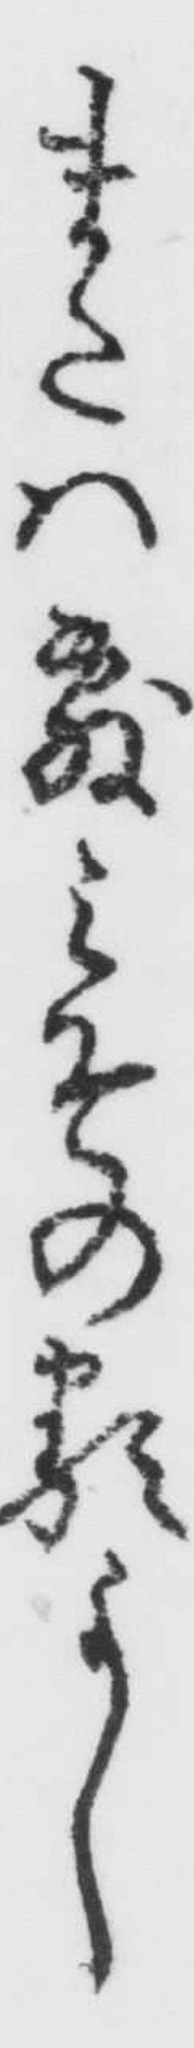または敷みその類よし

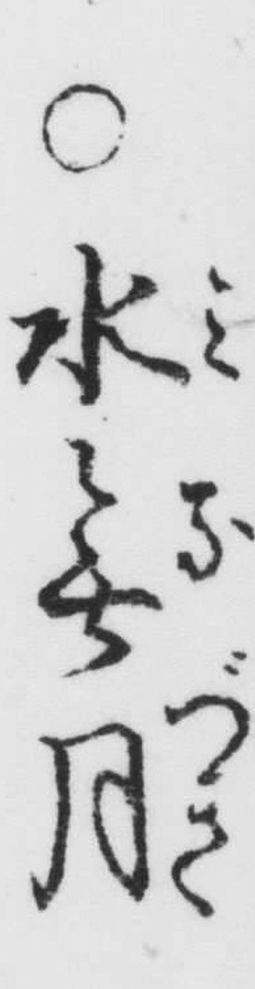○水無月
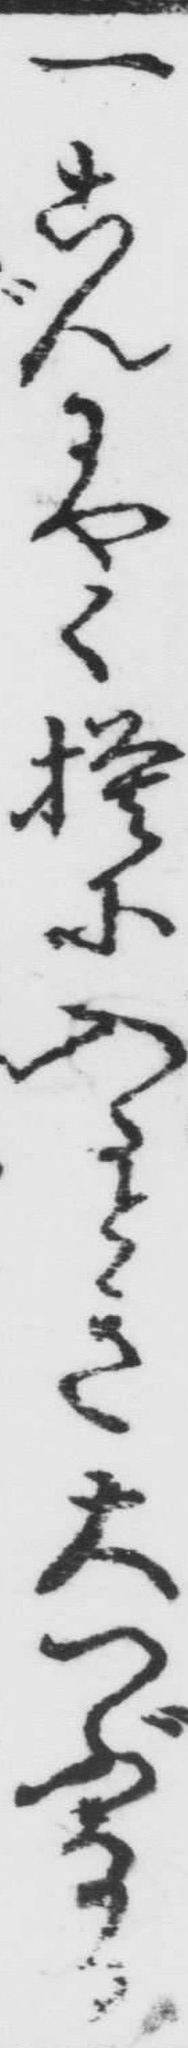一こんにやく模に入るとき大つぶなる
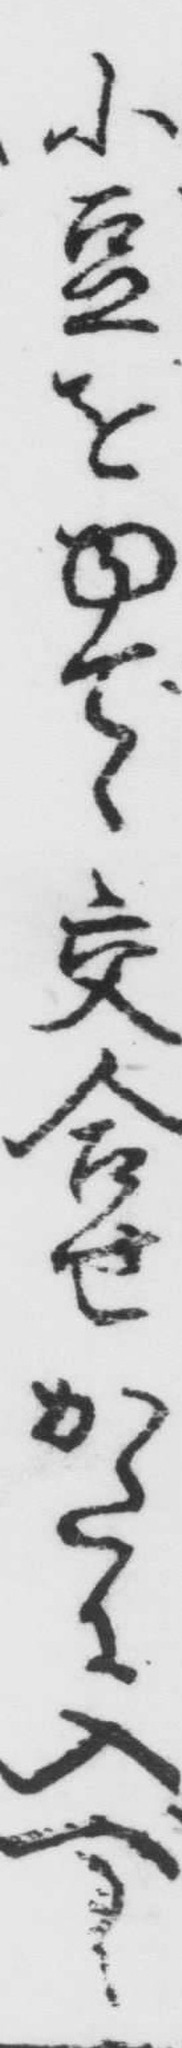小豆をゆでゝ交合せかたに入べし
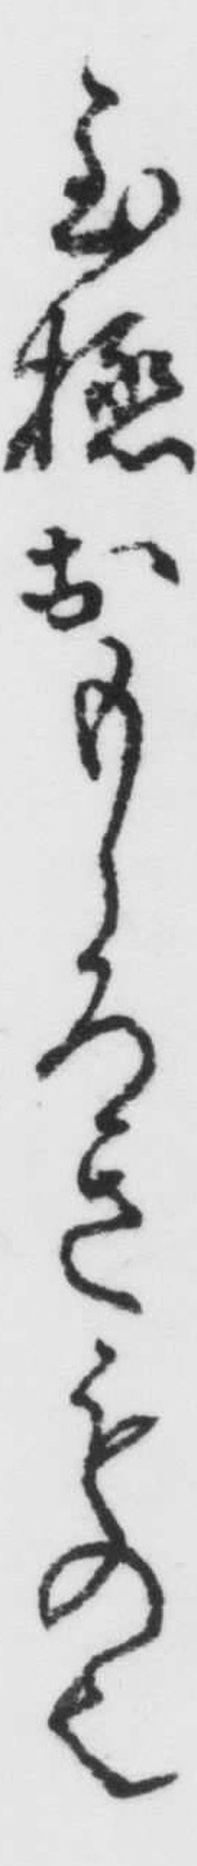至極おもしろきもの也
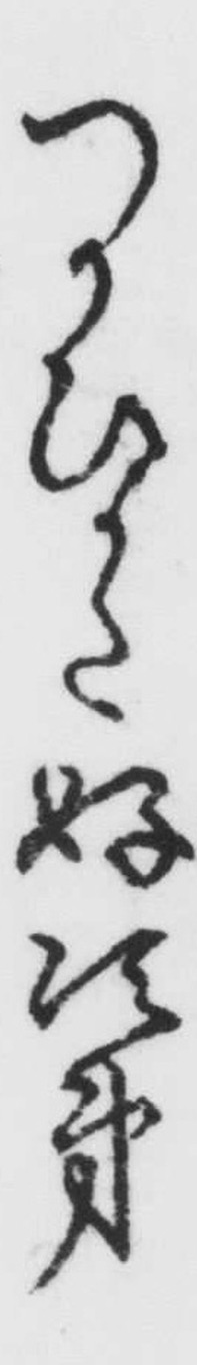つかひかた好次第
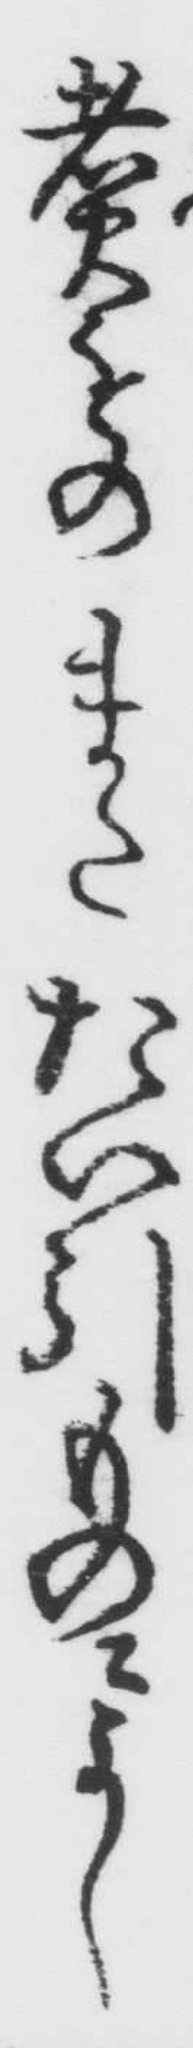煮ものまただい引ものによし
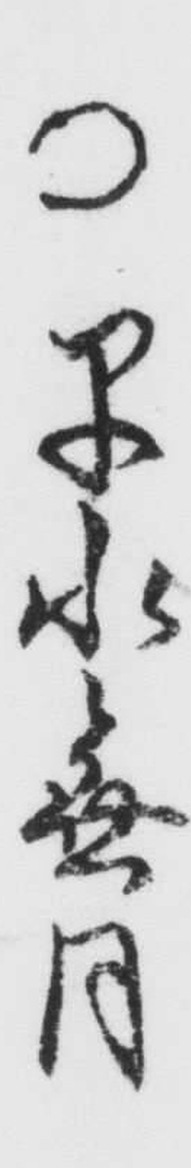○早水無月
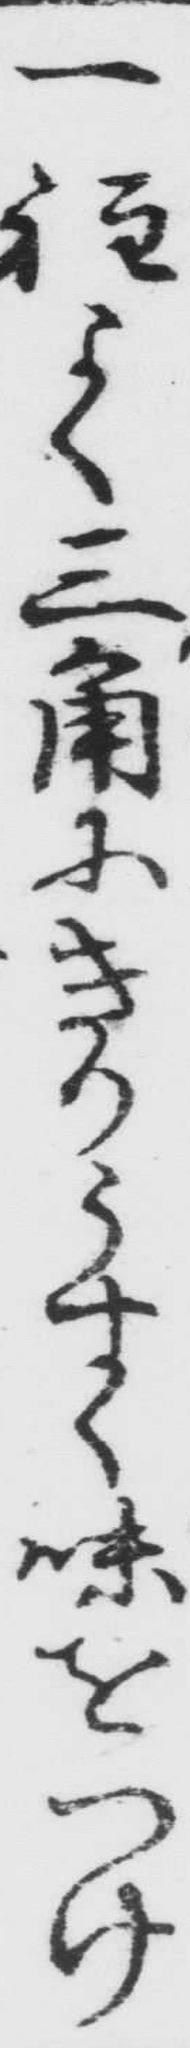一程よく三角にきりうすく味をつけ
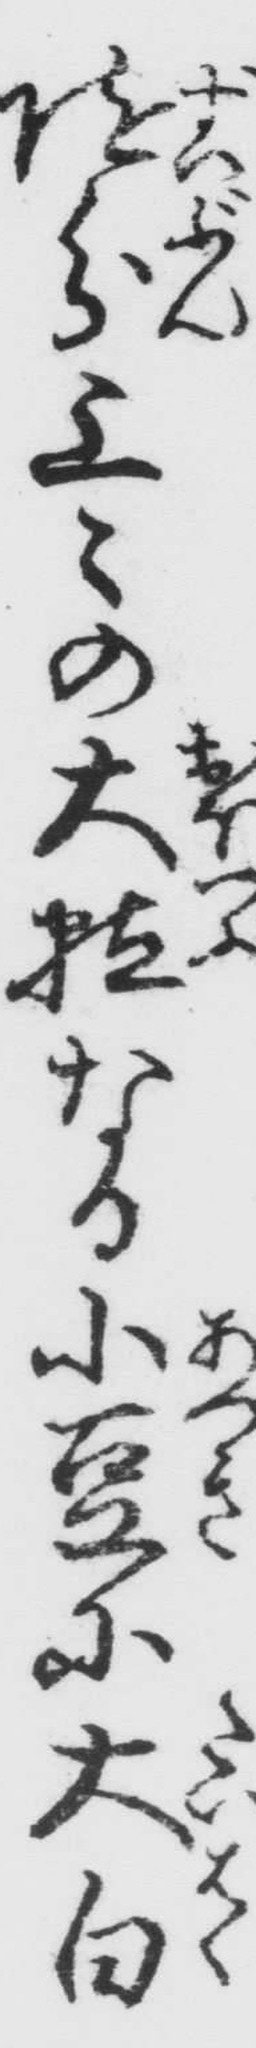随分上々の大粒なる小豆に大白
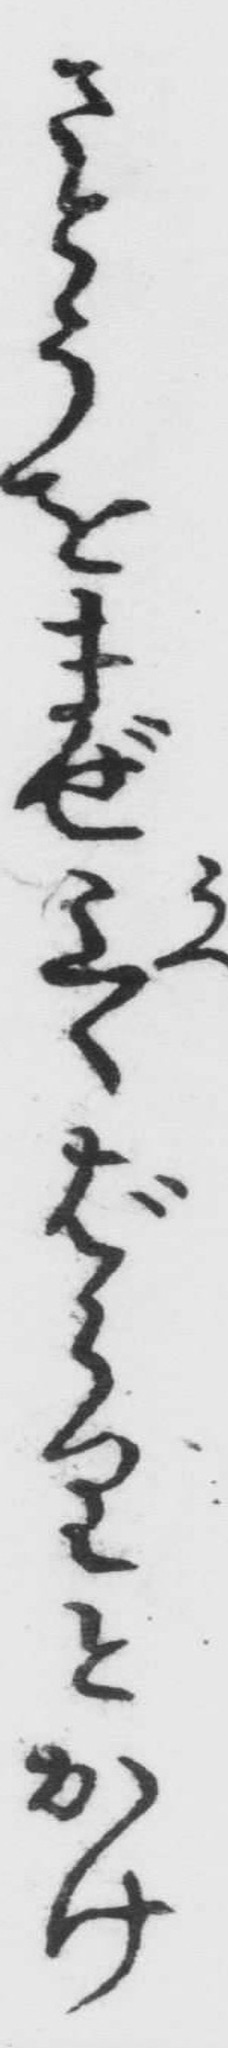さとうをまぜ上へばらりとかけ
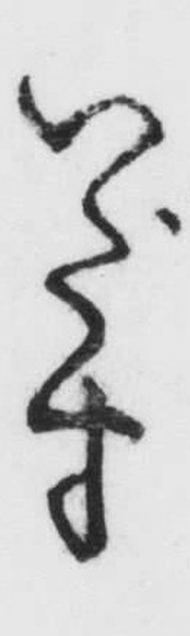いだす
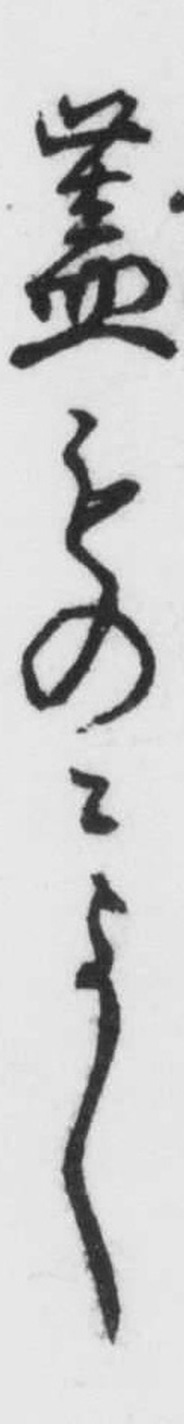蓋ものによし
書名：蒟蒻百珍
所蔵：大阪府立大学学術情報センター 国文学研究資料館
